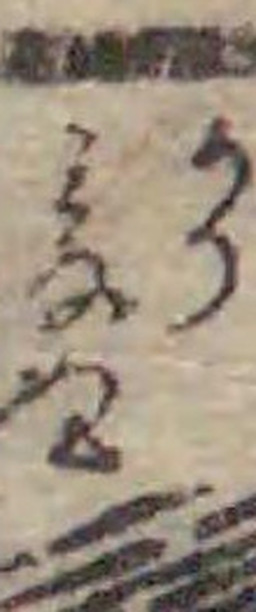みな様
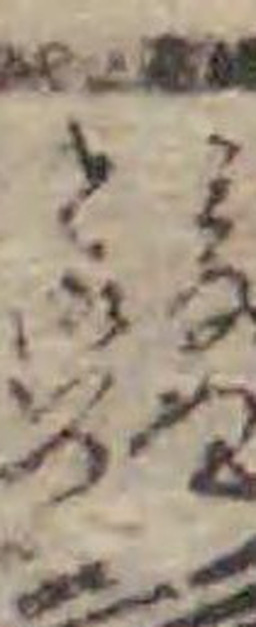と御いつ
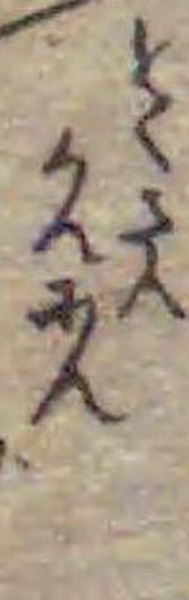かんにん
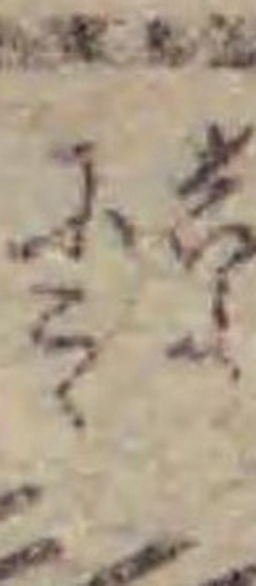にこゝ
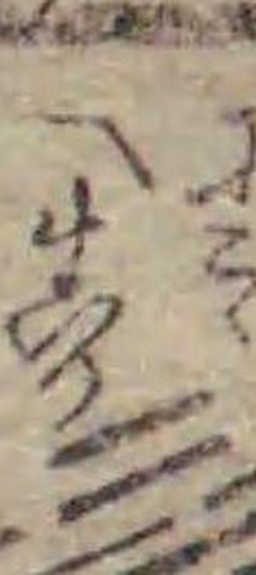へまいり
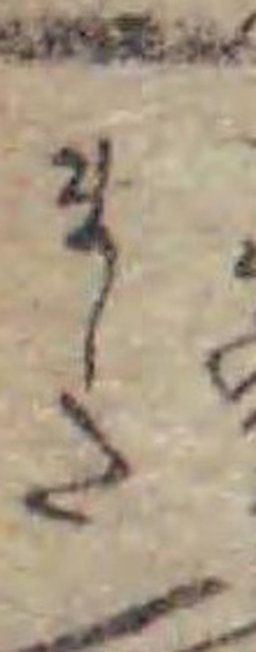ました

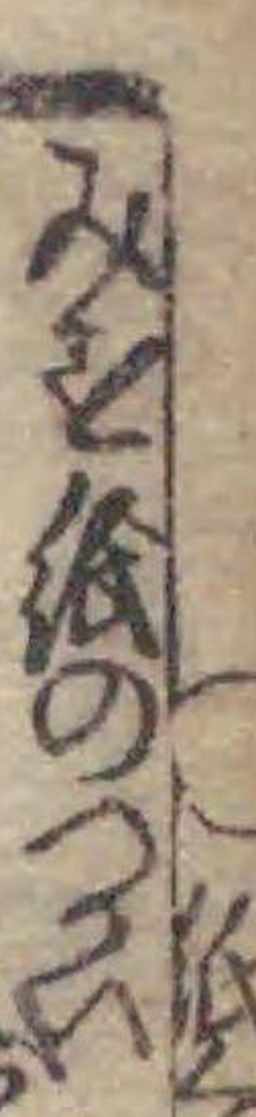みす紙のつかい
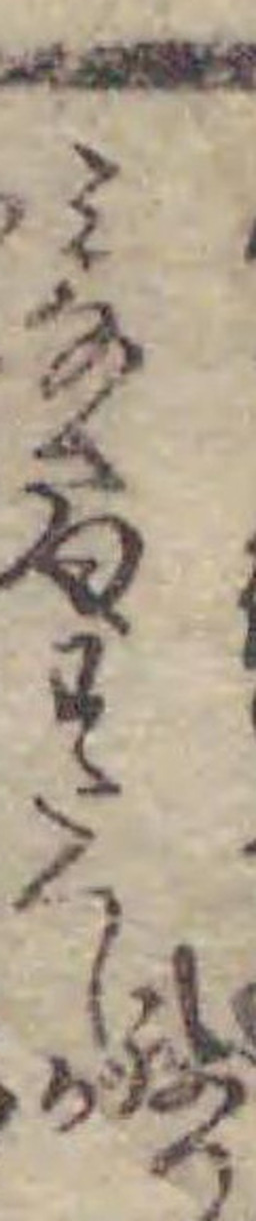みなさまわたくしが
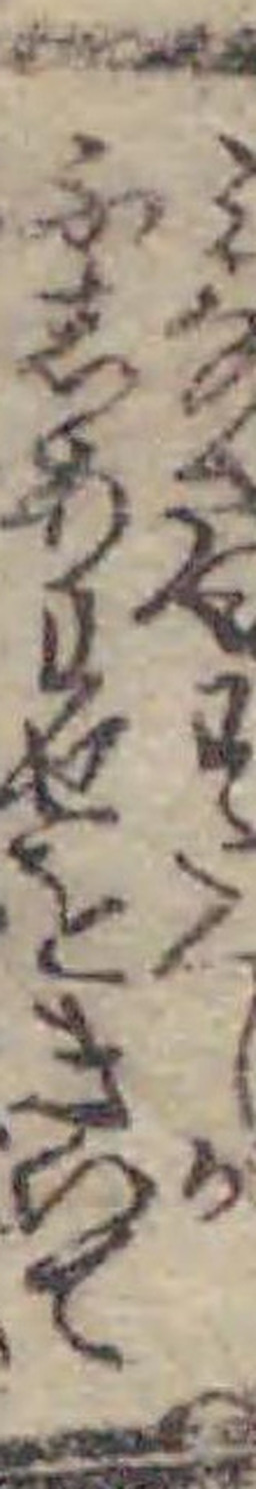ふしあわせをきいて
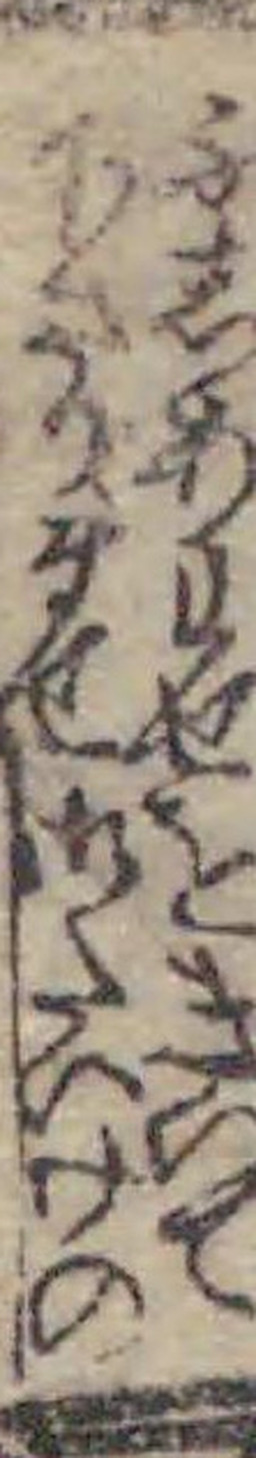下さりませ御たいけの
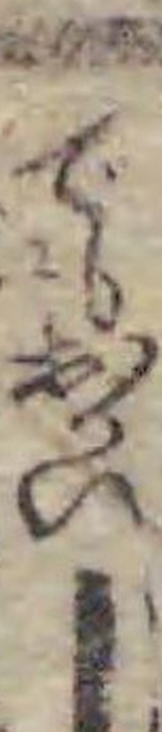でもおかい
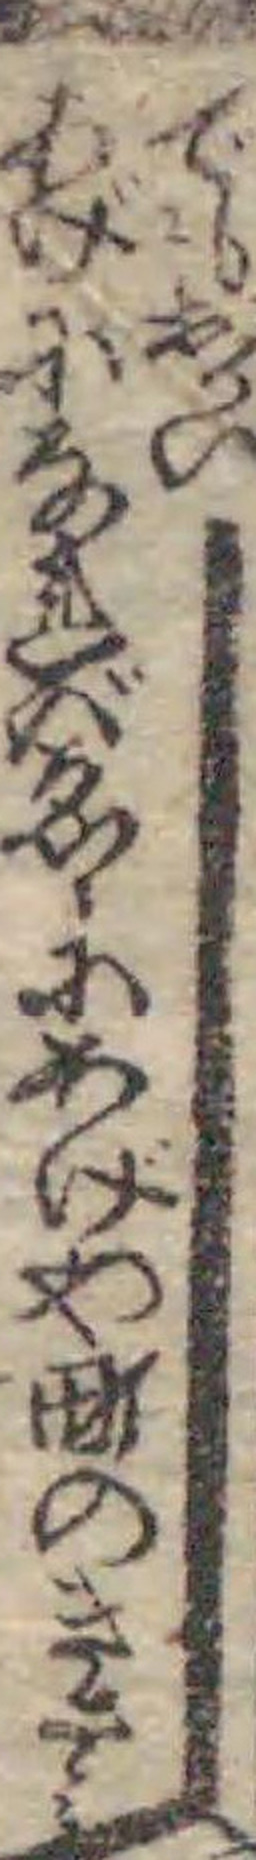あげになればゑゝにあげや町のきさみ
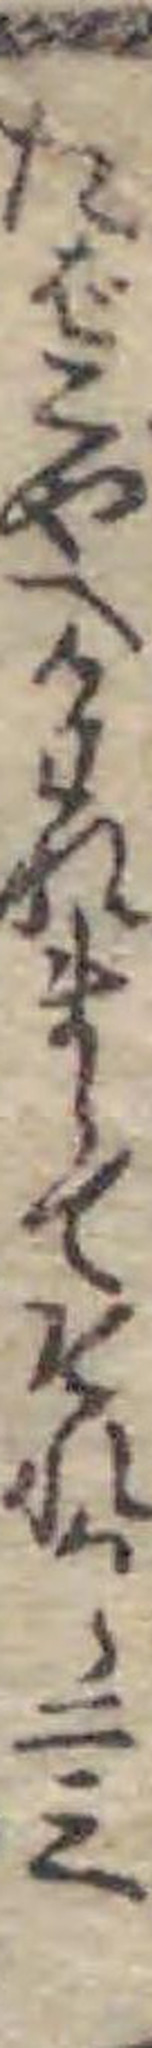たばこやへかわれましてそれから二三
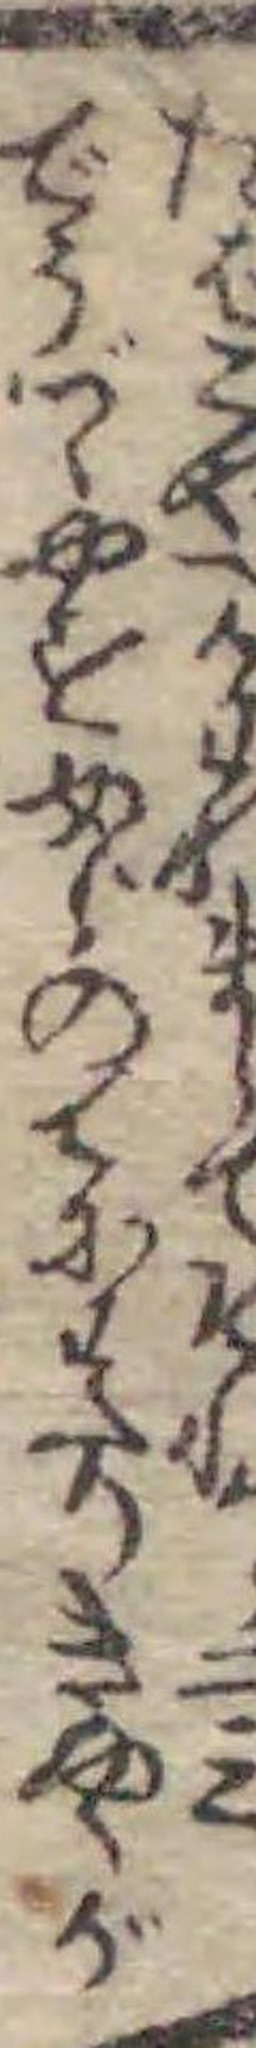でうづゝやす女郎のてにわたりきやくが
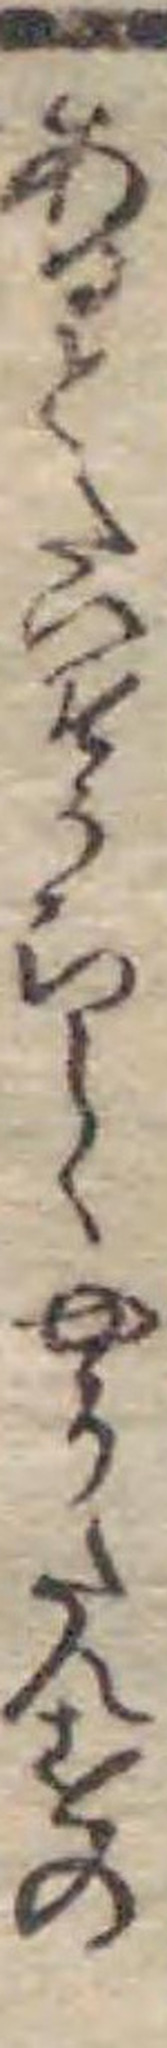あるとたいそうらしくやうたんすの
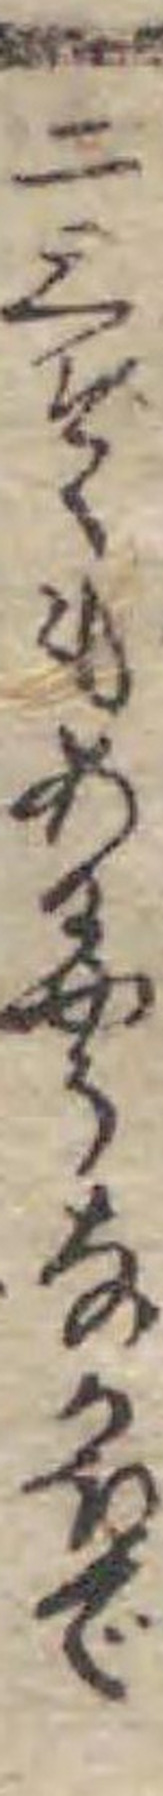二三そくもあるやうなかほで
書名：紙屑身上噺 : 3巻
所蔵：国立国会図書館 National Diet Library, JAPAN
